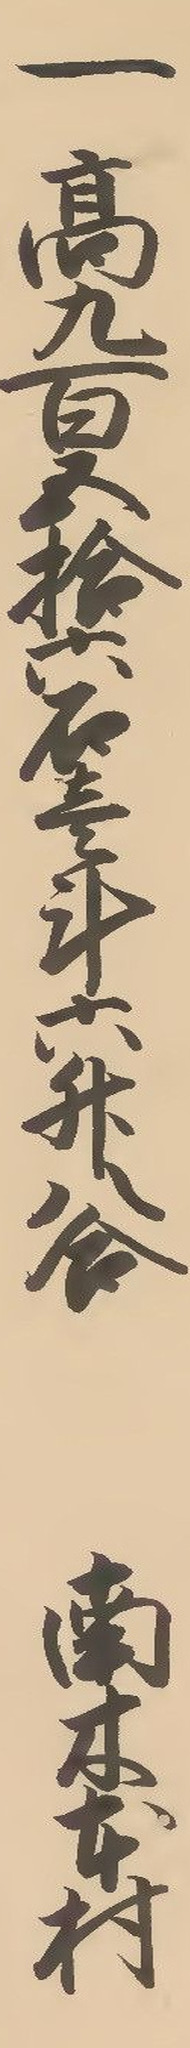一高九百五拾六石壱斗六升八合南木本村
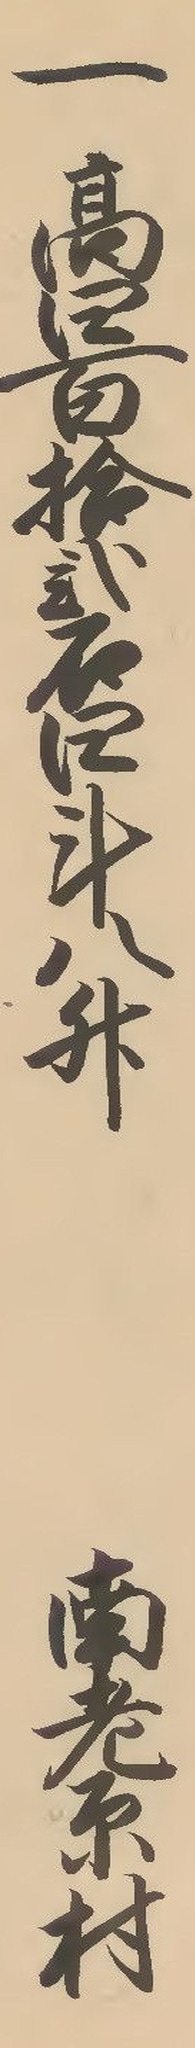一高四百拾弐石四斗八升南老原村
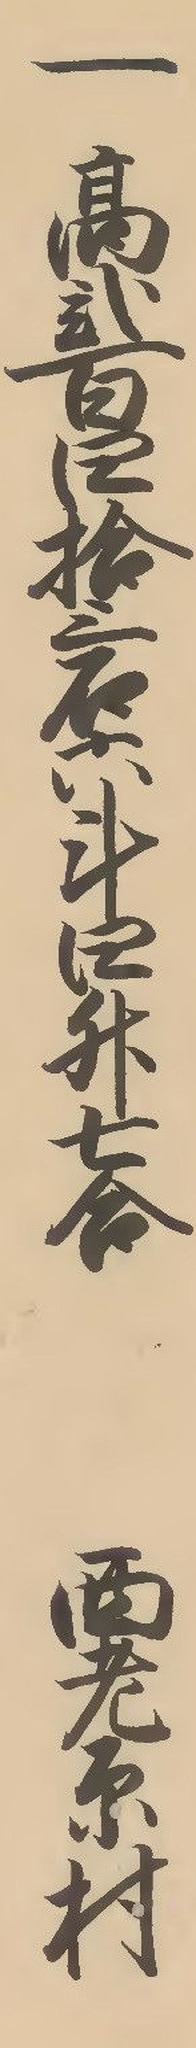一高弐百四拾三石六斗四升七合西老原村
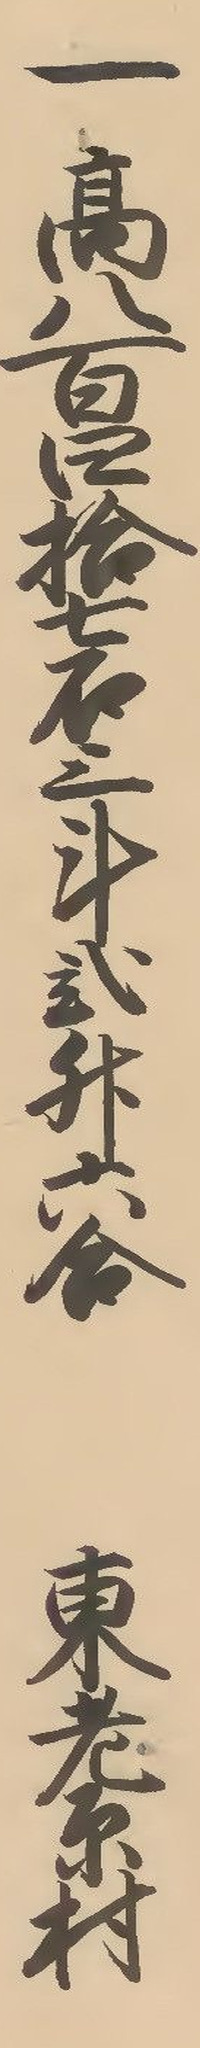一高八百四拾七石三斗弐升六合東老原村
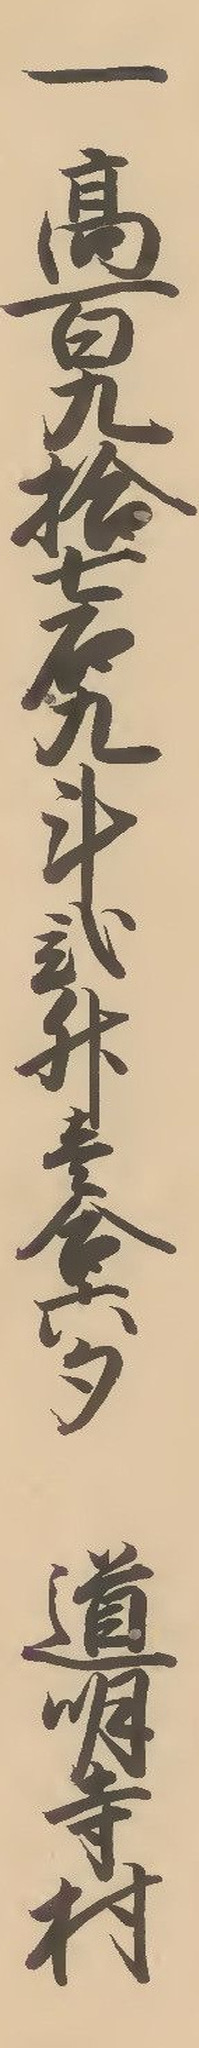一高百九拾七石九斗弐升壱合六勺道明寺村

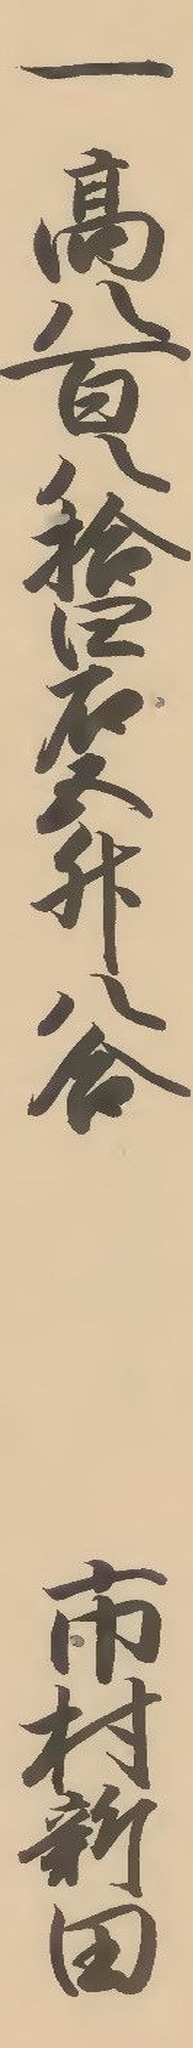一高八百八拾四石五升八合市村新田
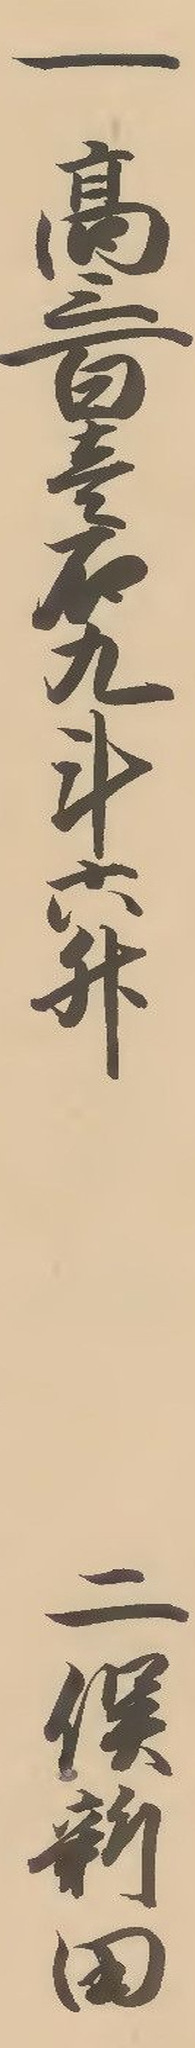一高三百壱石九斗六升二俣新田
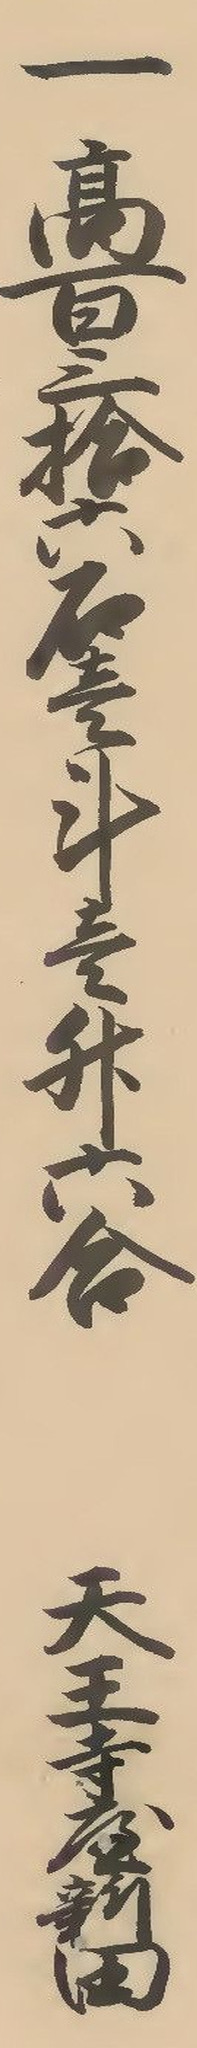一高百三拾六石壱斗壱升六合天王寺屋新田
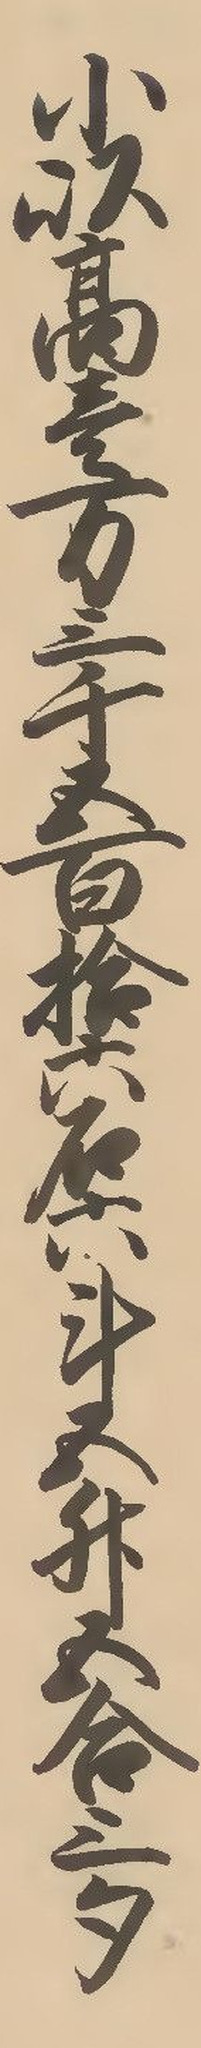小以高壱万三千五百拾六石六斗五升五合三勺

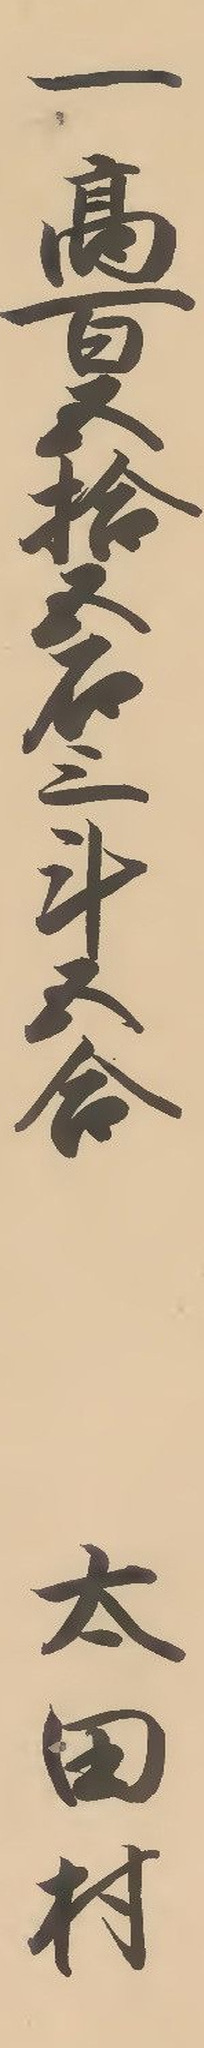一高百五拾五石三斗五合太田村
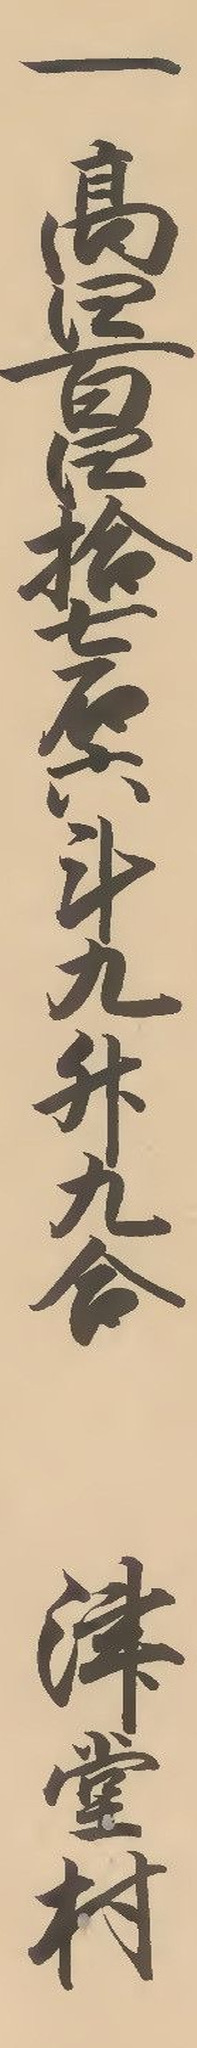一高四百四拾七石六斗九升九合津堂村
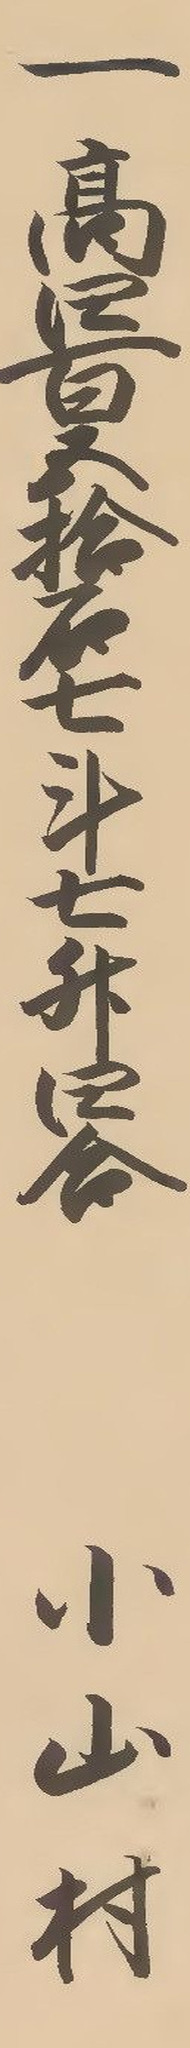一高四百五拾石七斗七升四合小山村
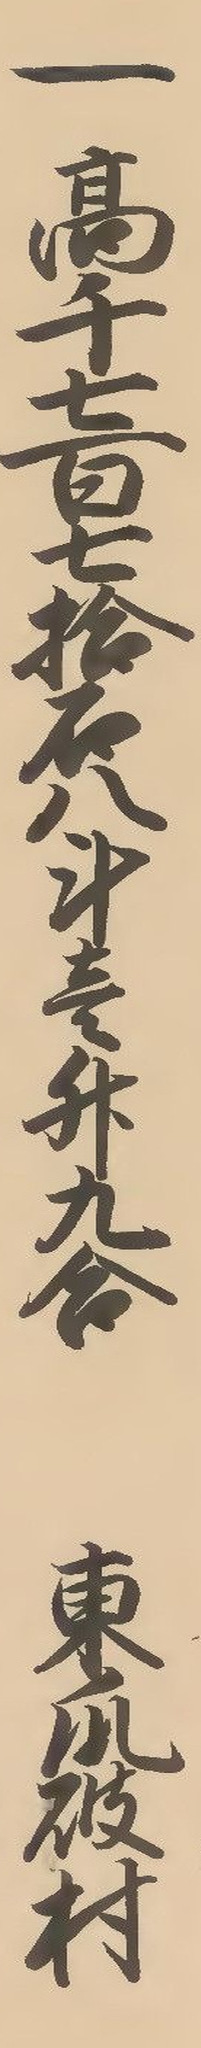一高千七百七拾石八斗壱升九合東瓜破村
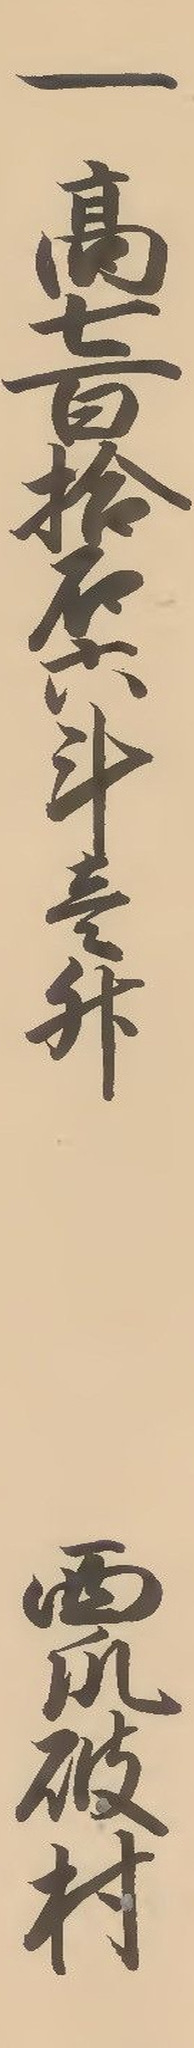一高七百拾石六斗壱升西瓜破村
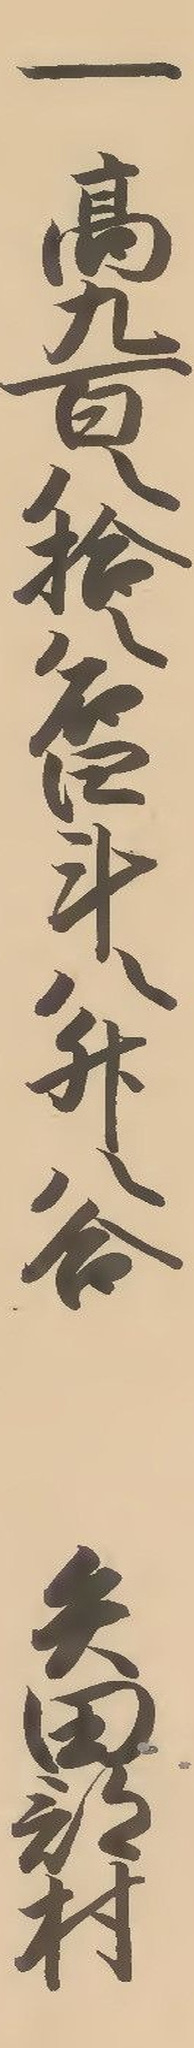一高九百八拾八石四斗八升八合矢田部村
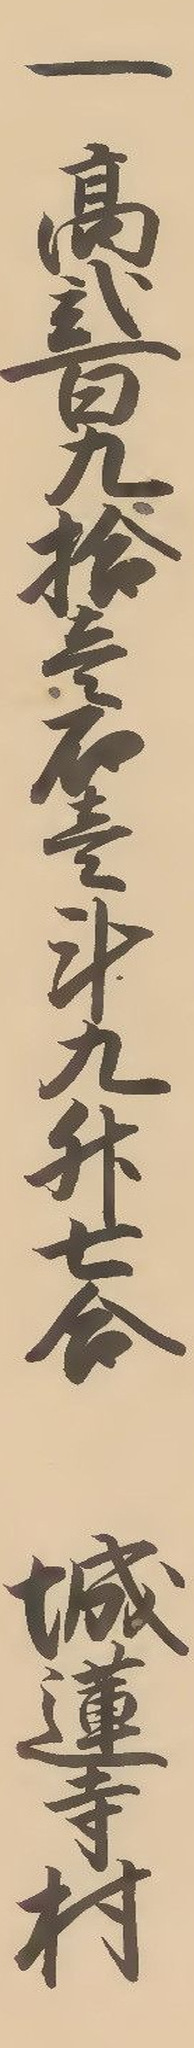一高弐百九拾壱石壱斗九升七合城蓮寺村
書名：河内国郷帳
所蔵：国立公文書館 National Archives of Japan
